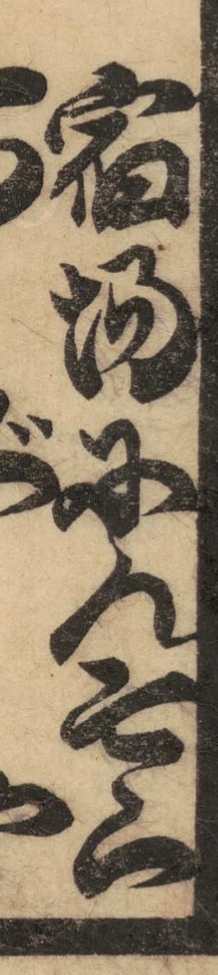同宿場にんそく
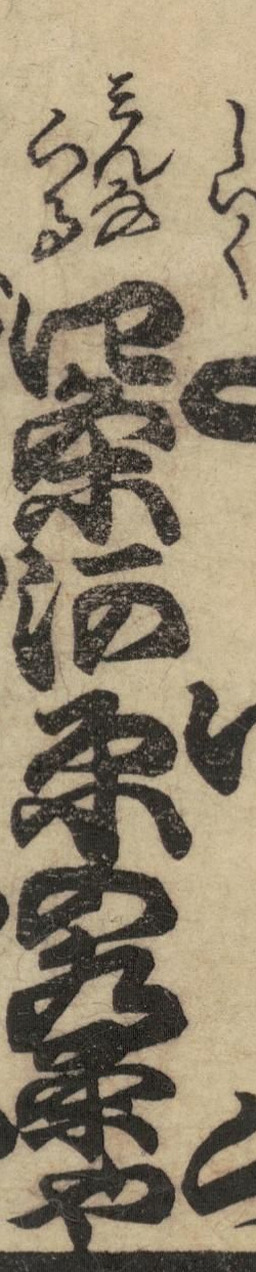同みんなくる四条河原の水茶や
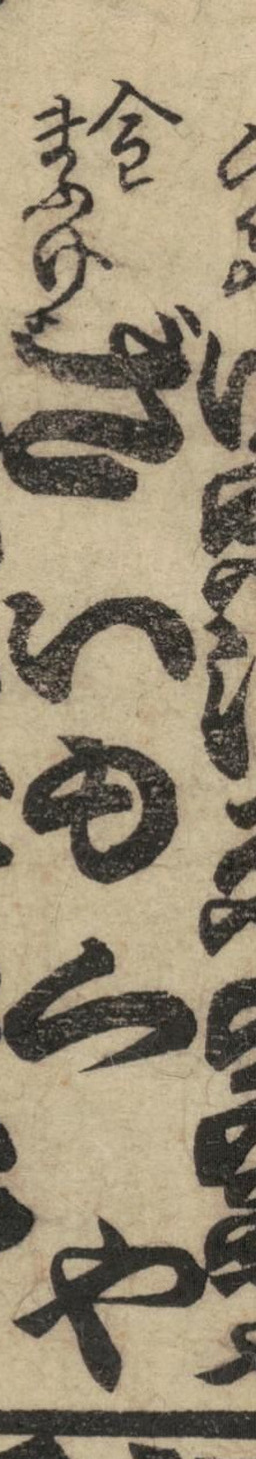同金まふけざいもくや
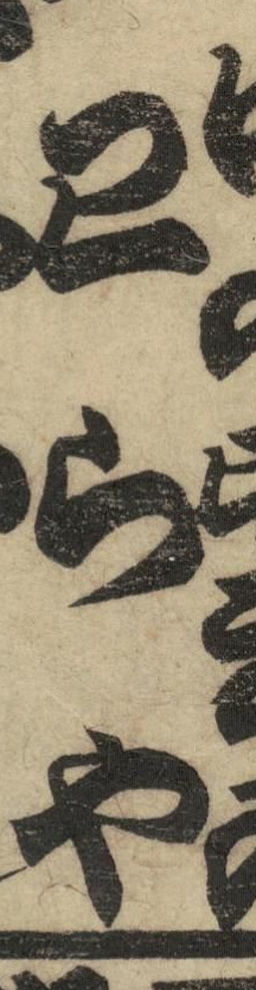わらじ
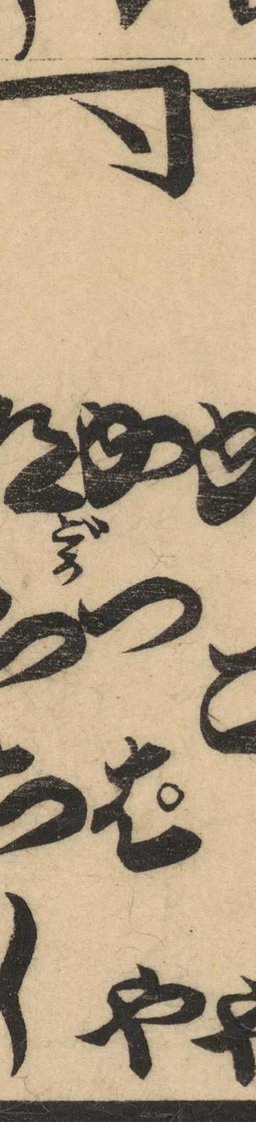同かつぱや
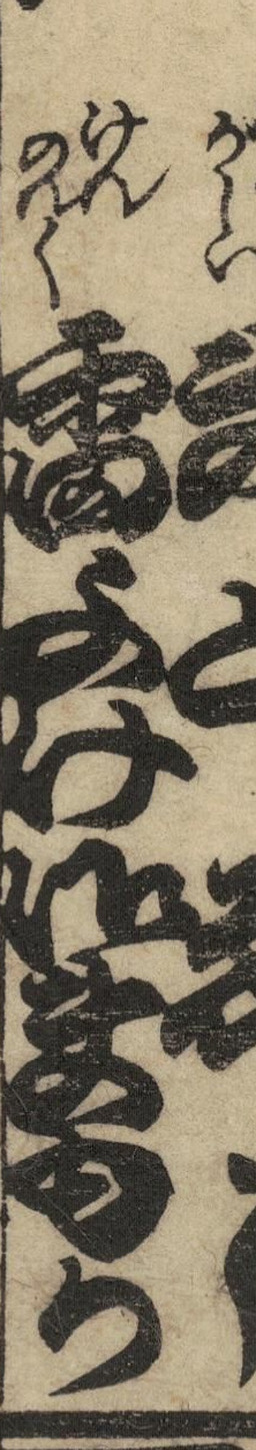同けんのん〳〵雷よけ御まもり
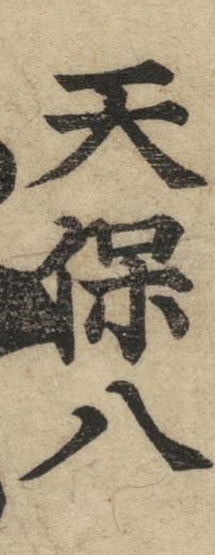天保八
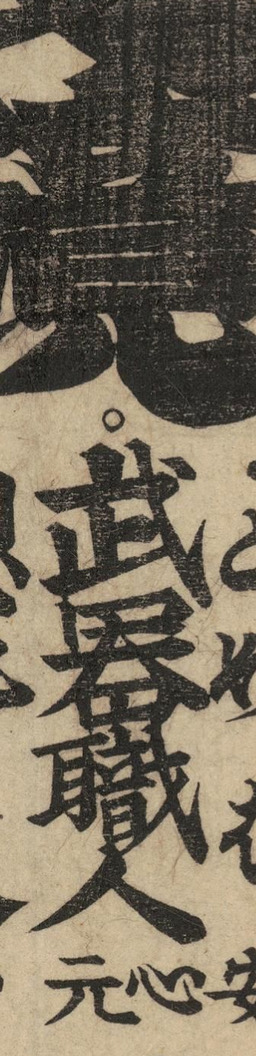○武器職人
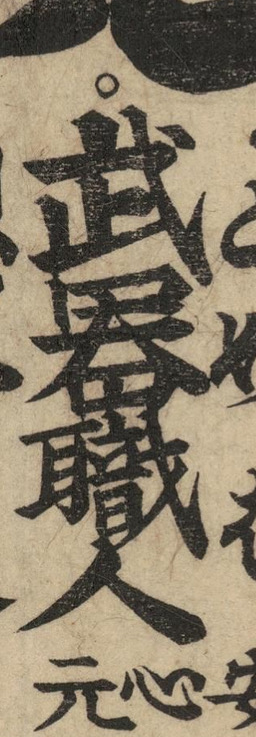○武器職人
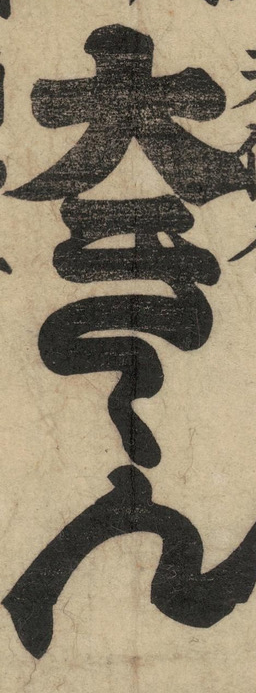大きゝん
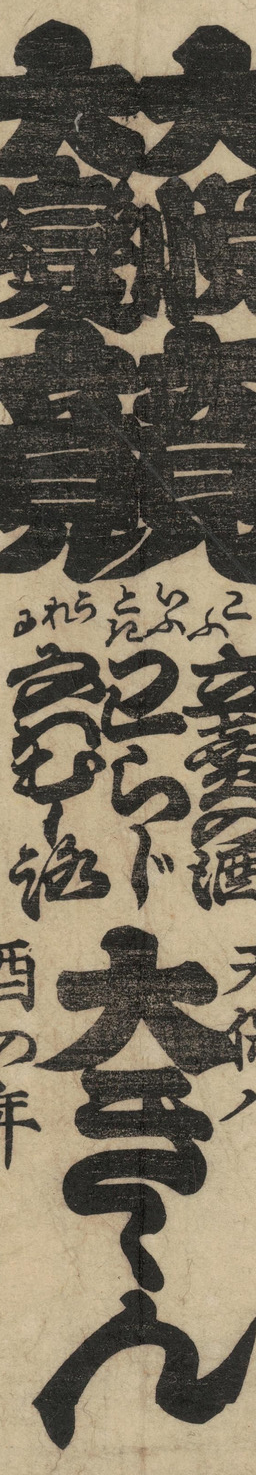大きゝん
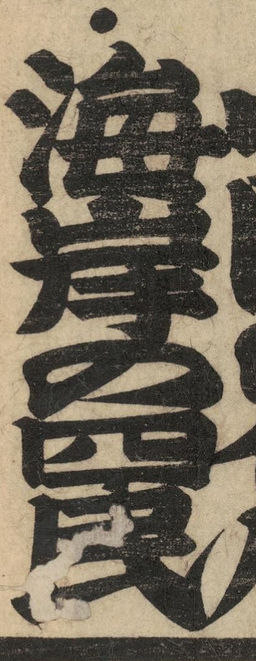●海岸の四民
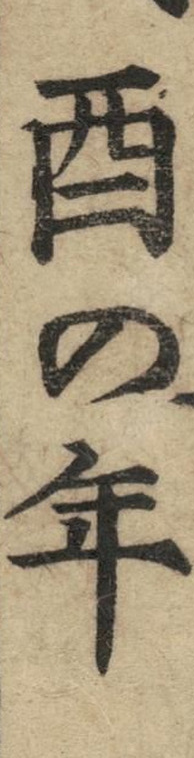酉の年
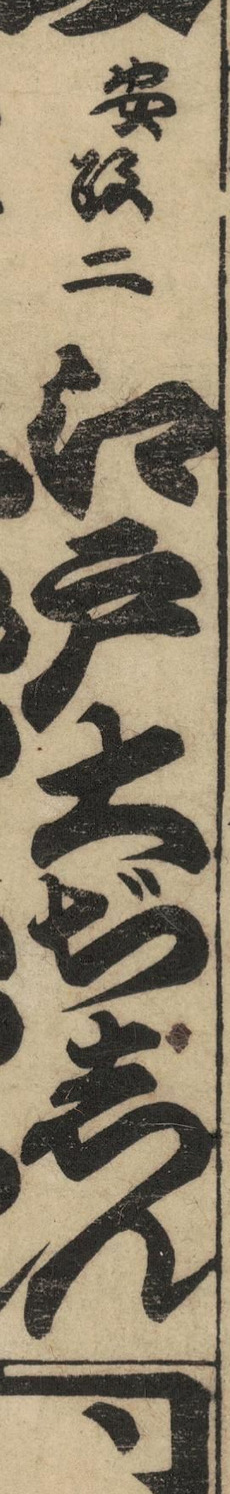大変安政二江戸大ぢしん
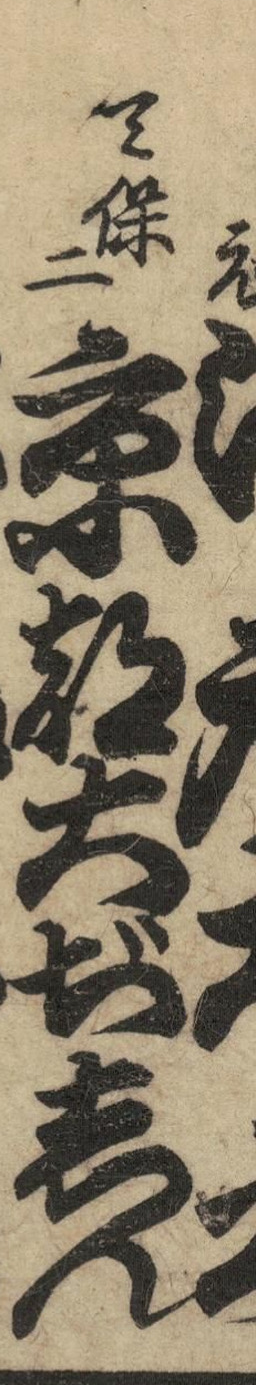同天保二京都大ぢしん
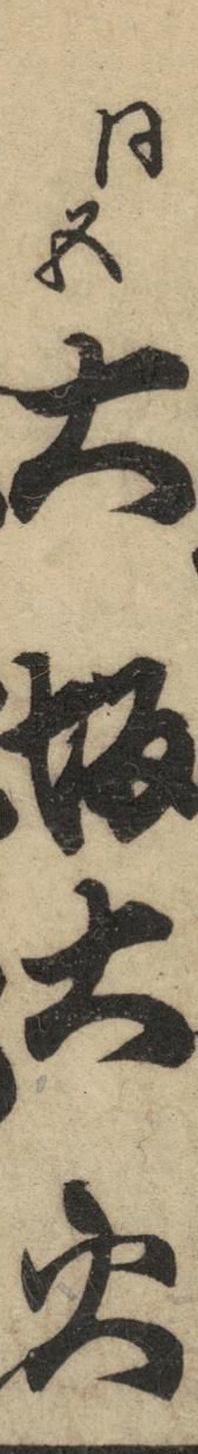同同五大坂大火
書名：大悦大變競・盛衰競
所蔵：東京大学地震研究所図書室 Earthquake Research Institute Library, The University of Tokyo, JAPAN
